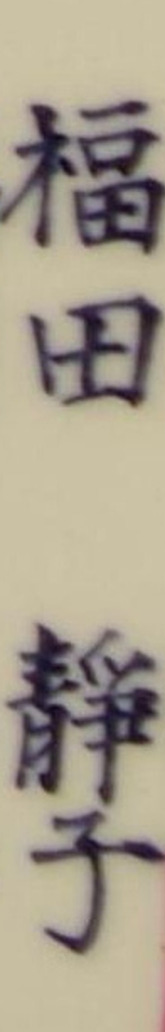福田静子
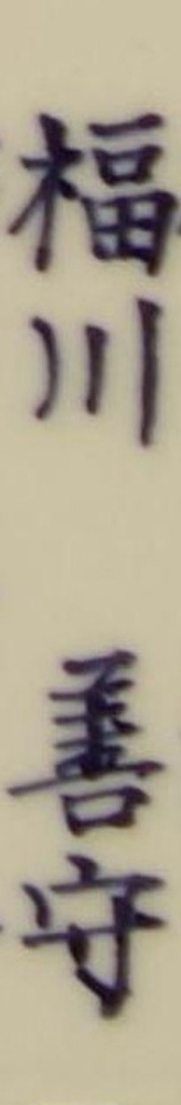福川善守
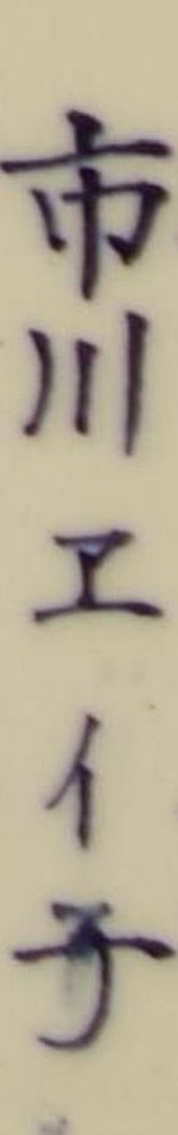市川エイ子
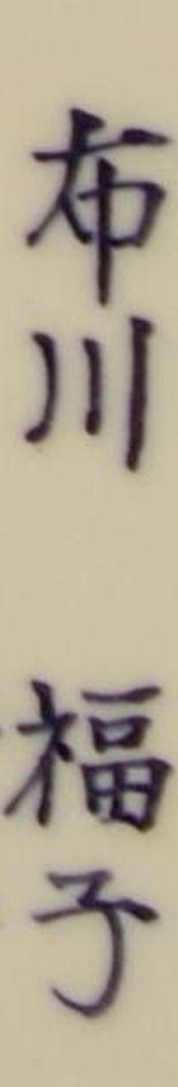布川福子
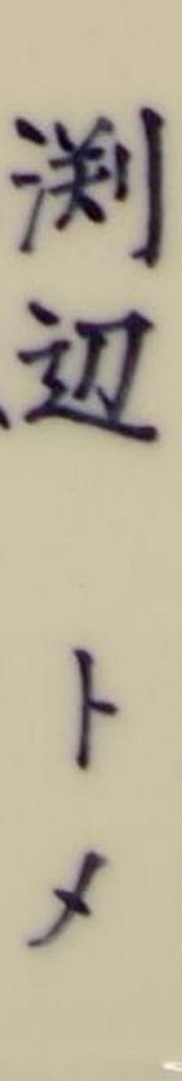渕辺トメ
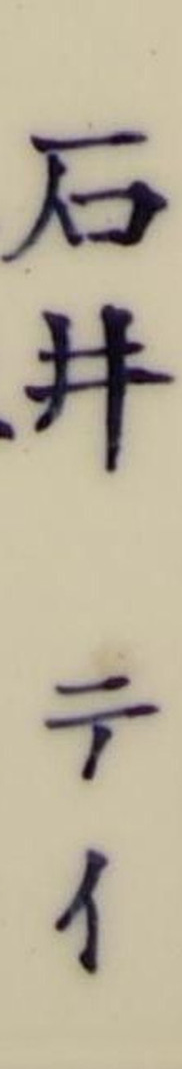石井テイ
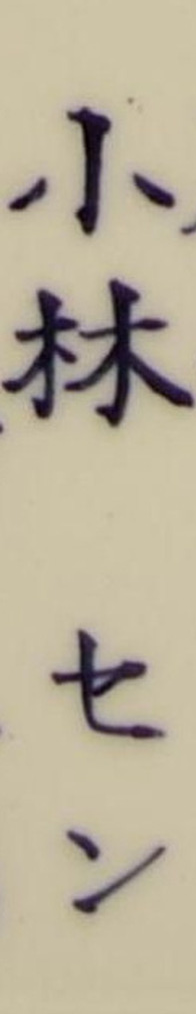小林セン
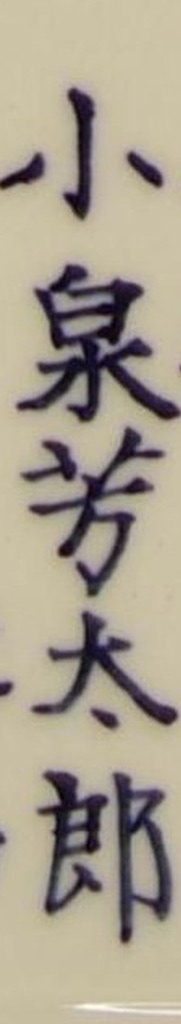小泉芳太郎
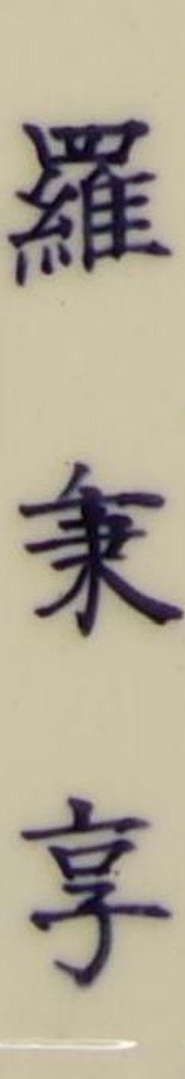羅乗享
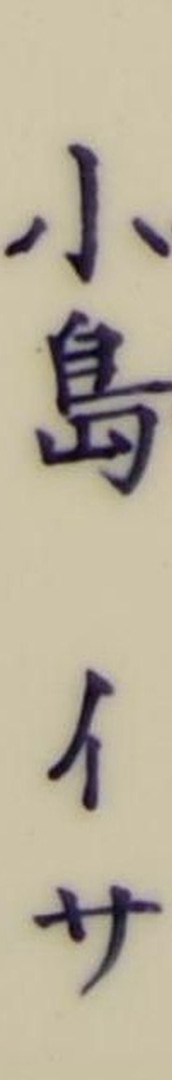小島イサ
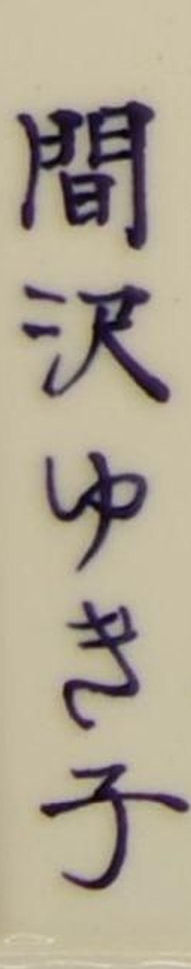間沢ゆき子

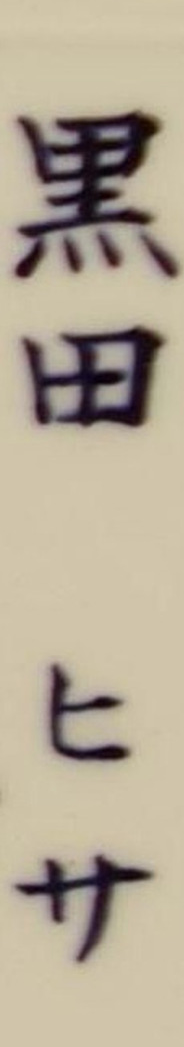黒田ヒサ
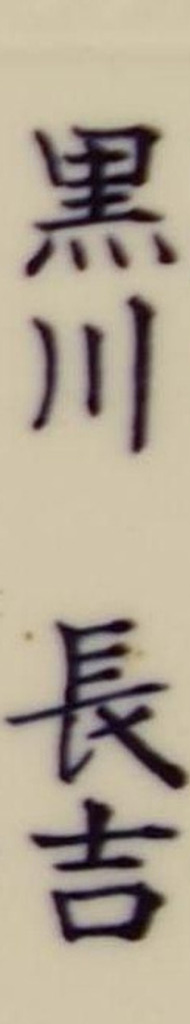黒川長吉
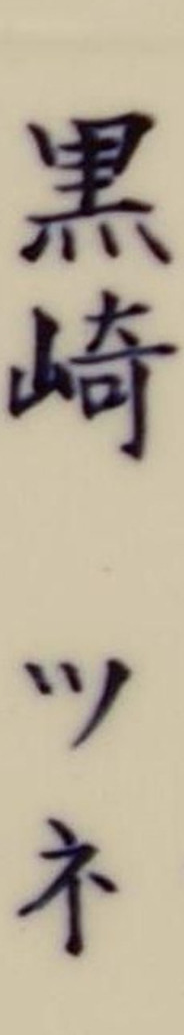黒崎ツネ
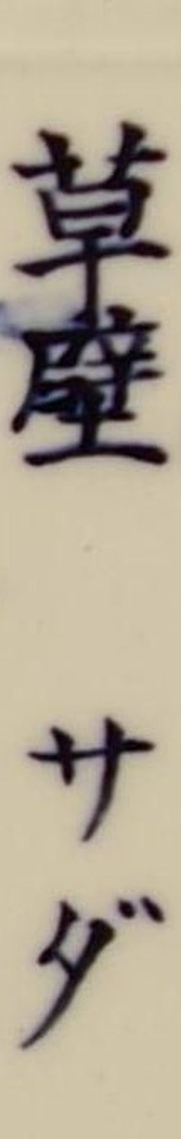草壁サダ
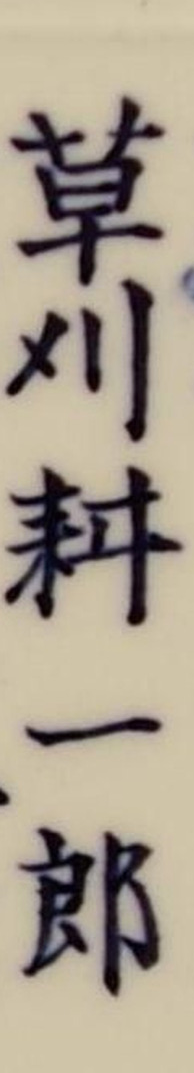草刈耕一郎
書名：E~L
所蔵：高野山金剛峯寺
